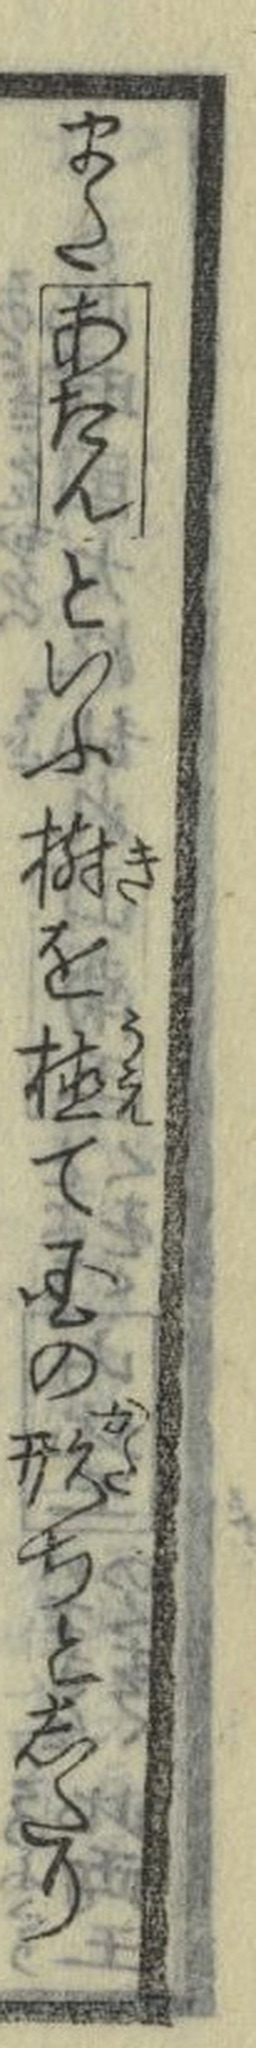また「あたん」といふ樹を植て国の形ちとしたり
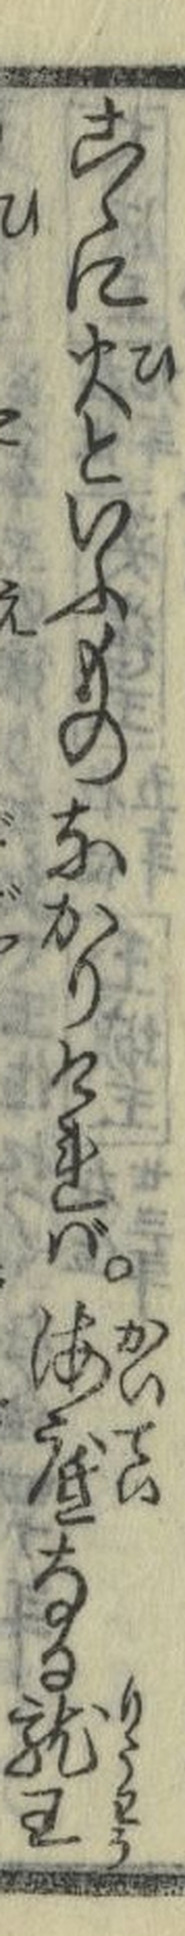こゝに火といふものなかりければ。海底なる竜王
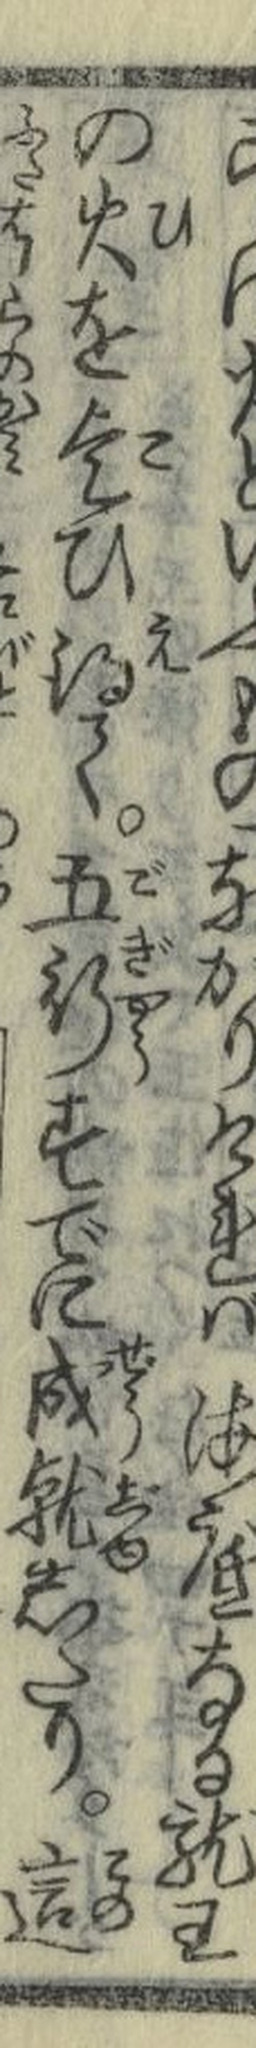の火を乞ひ得て。五行すでに成就したり。這
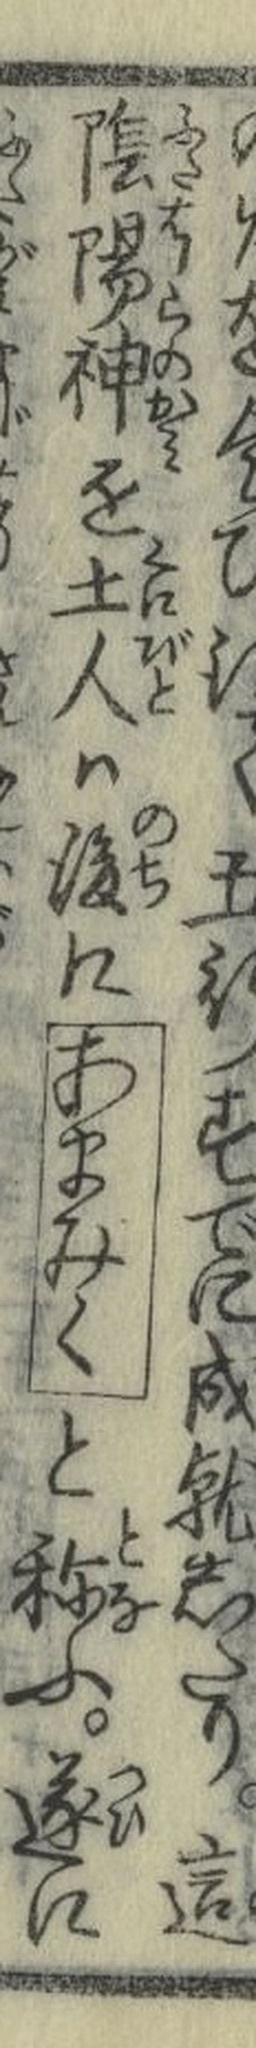陰陽神を土人は後に「あまみく」と称ふ。遂に
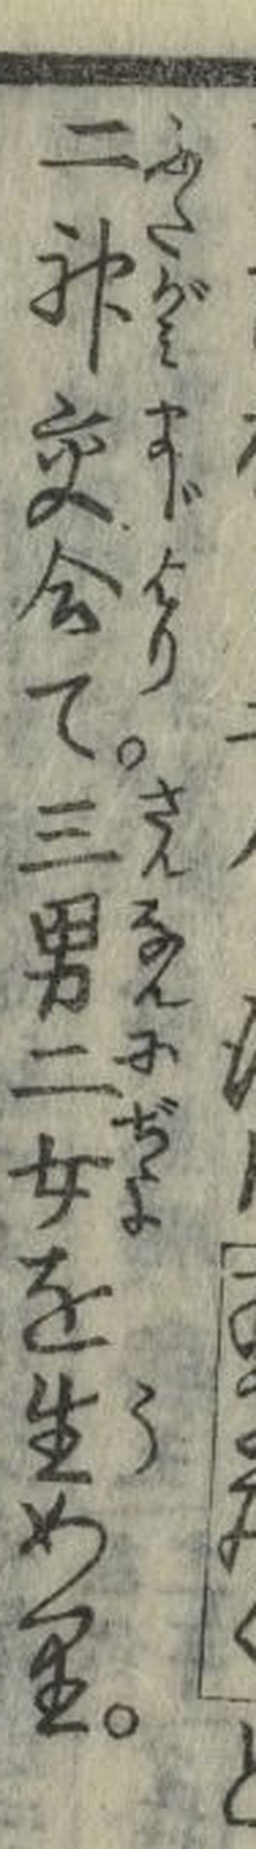二神交合て。三男二女を生めり。

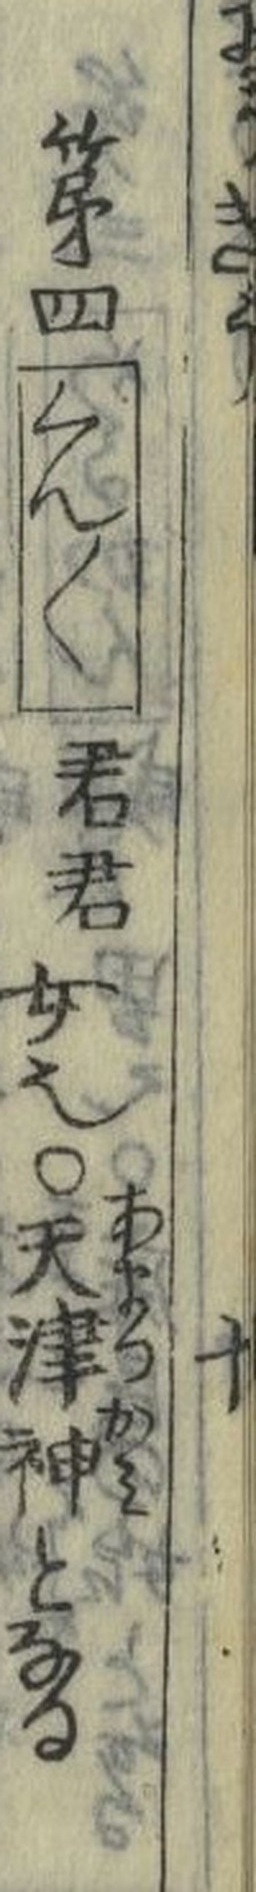第四「くん〳〵」君君女也○天津神となる
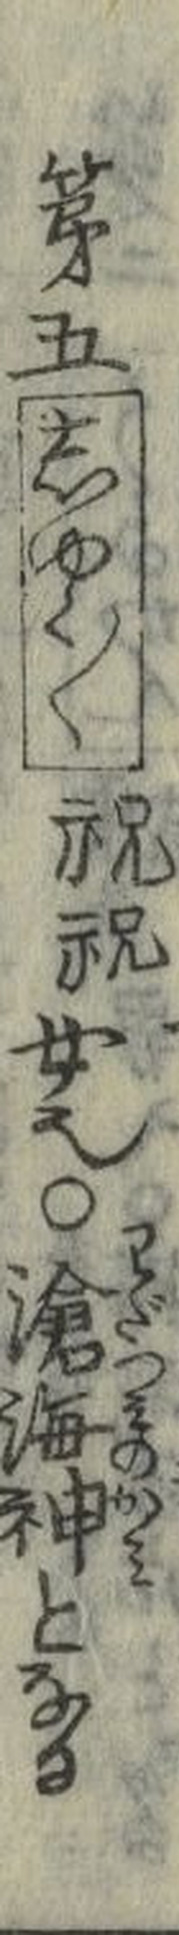第五「しゆく〳〵」祝祝女也○滄海神となる
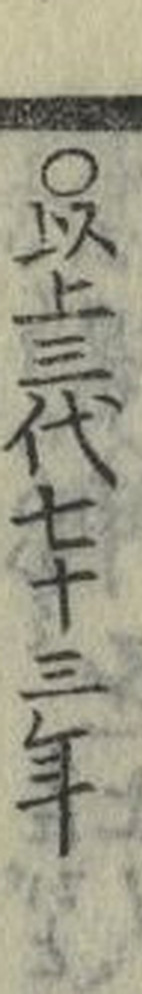○以上三代七十三年
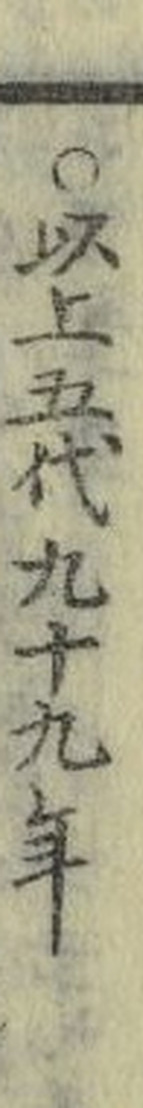○以上五代九十九年
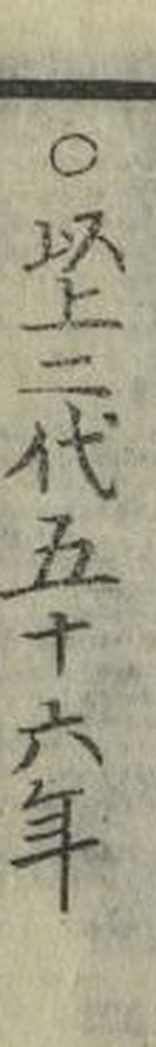○以上二代五十六年

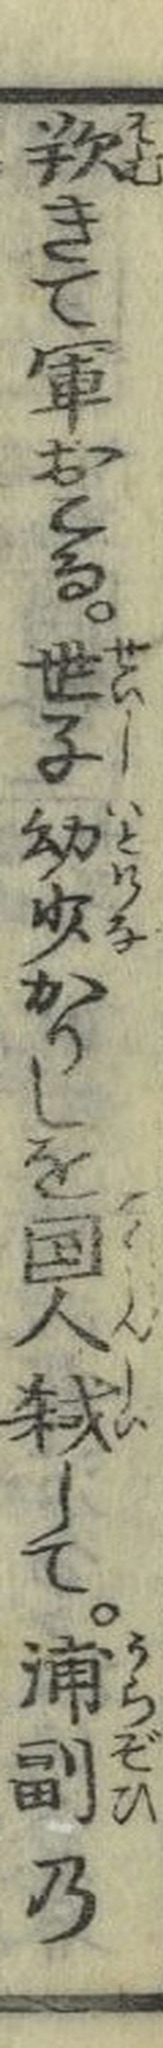叛きて軍おこる。世子幼少かりしを国人弑して。浦副の
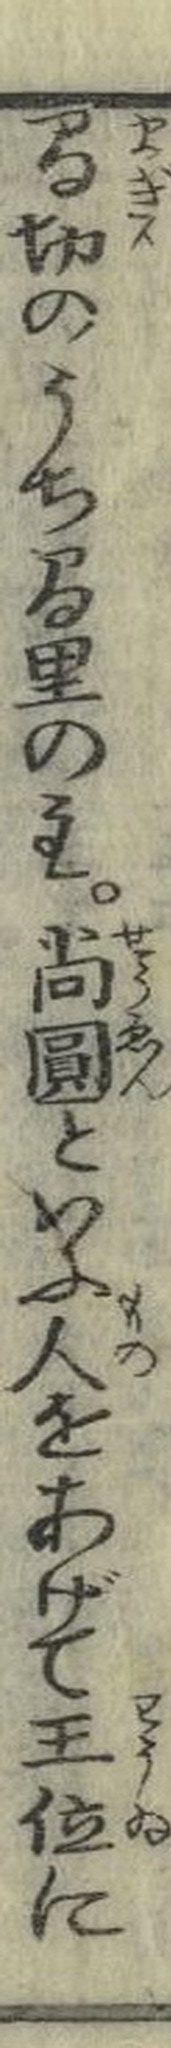間切のうち間里の主。尚円といふ人をあげて王位に
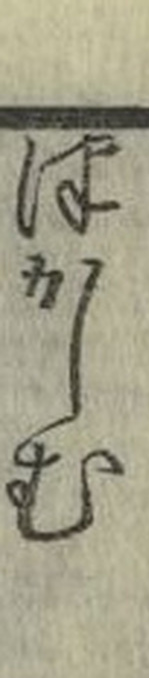つかしむ
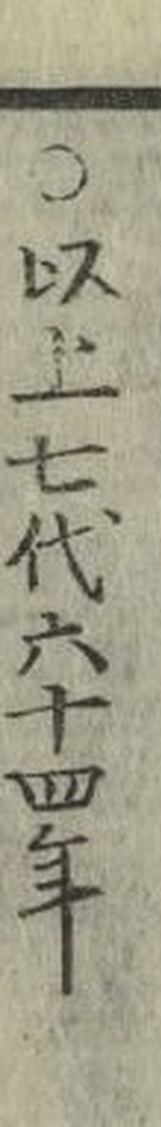○以上七代六十四年
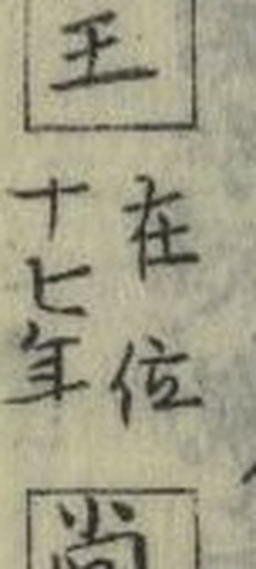三十七年
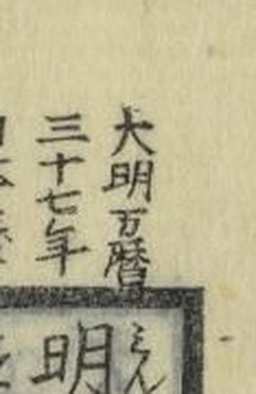大明万暦
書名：琉球奇譚
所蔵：University of the Ryukyus Library
